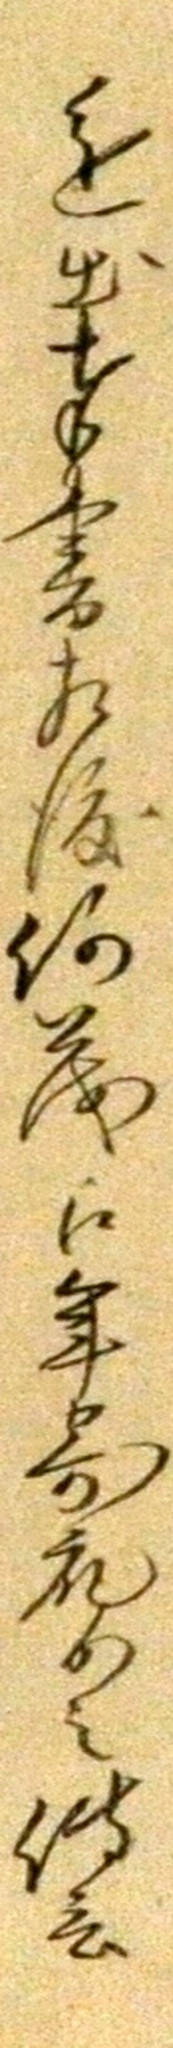進出奉書相渡何もえ年寄衆ゟ之伝言
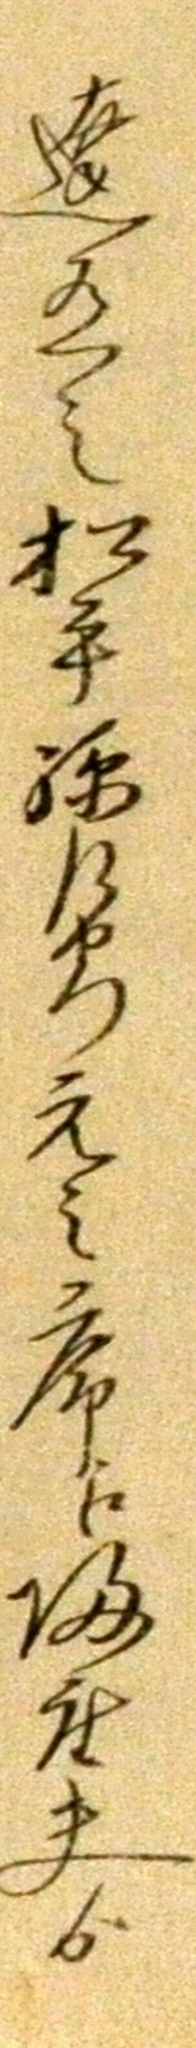達有之松平源左衛門元之席え帰座夫ゟ
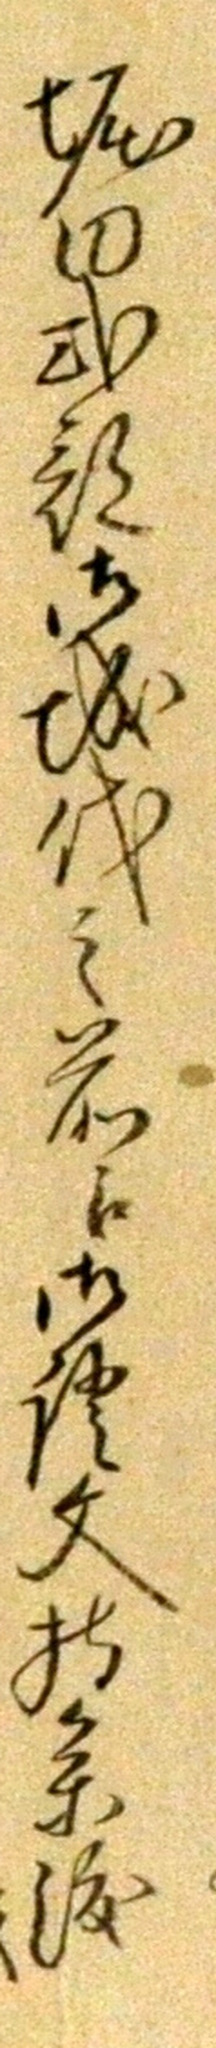堀田式部御城代之前え御證文持参渡之
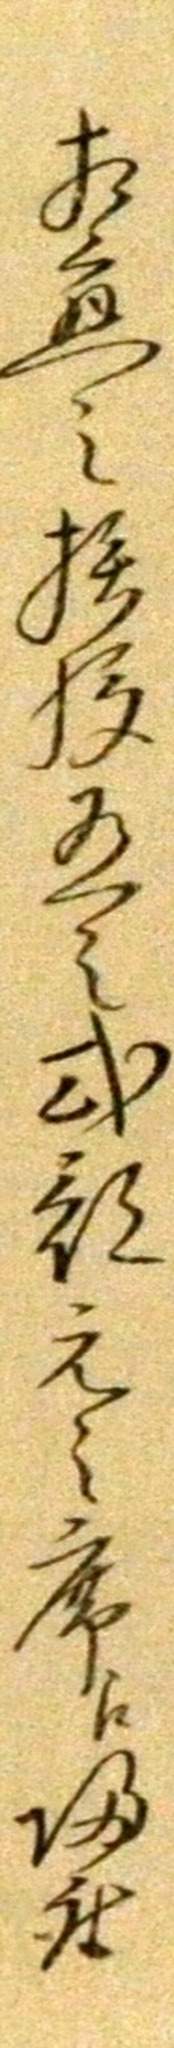相応之挨拶有之式部元之席え帰座
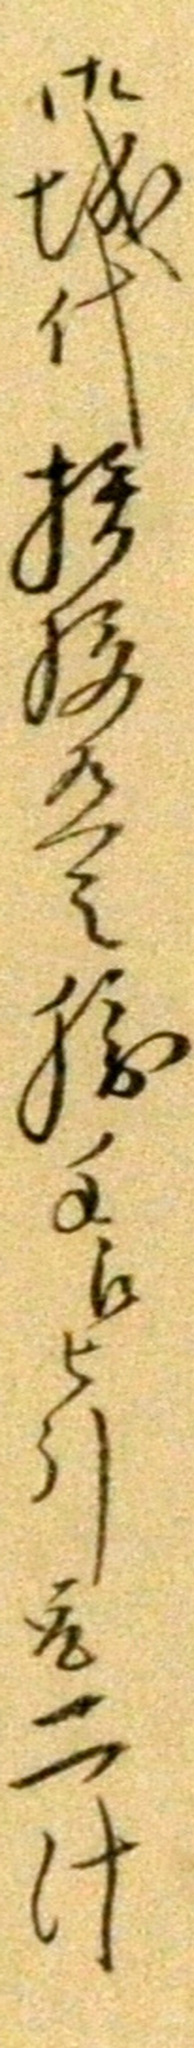御城代挨拶有之勝手え被引取二汁
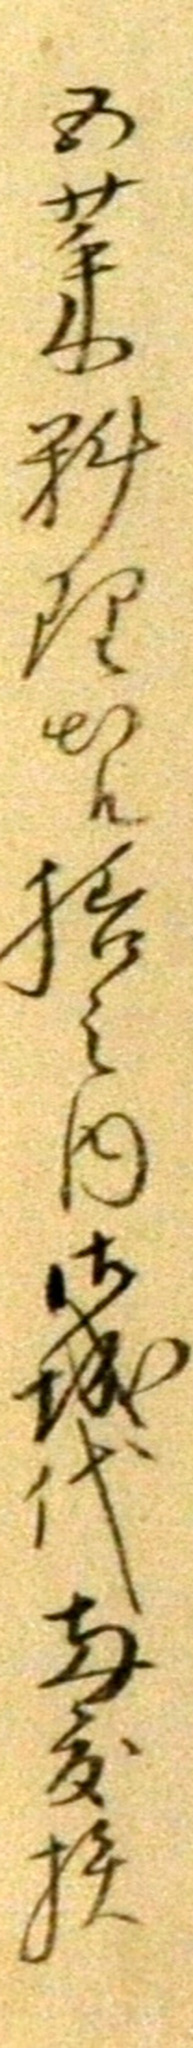五菜料理出ル膳之内御城代両度挨

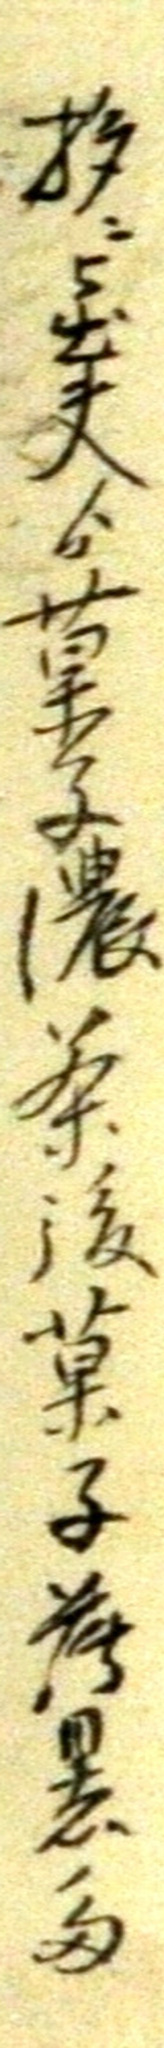拶ニ被出夫ゟ菓子濃茶後菓子薄目煮た
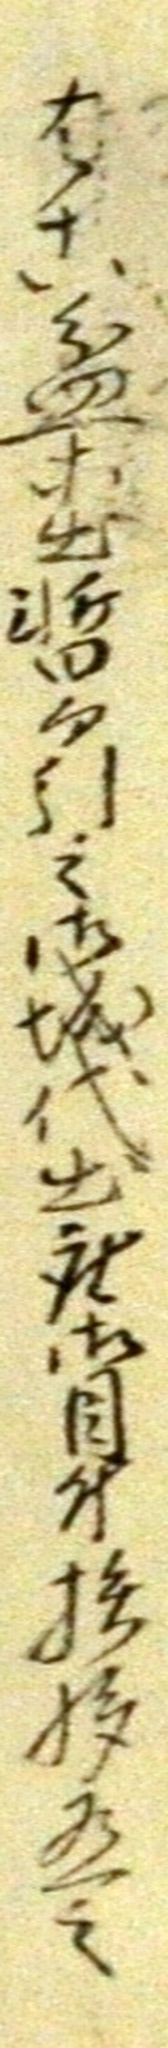はこ盆等出暫而引之御城代出座御目付挨拶有之
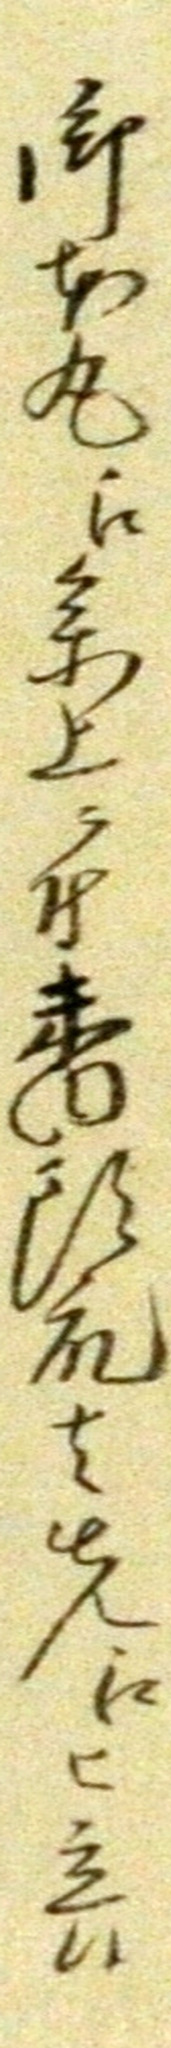御本丸江参上ニ付番頭衆は先江被立候
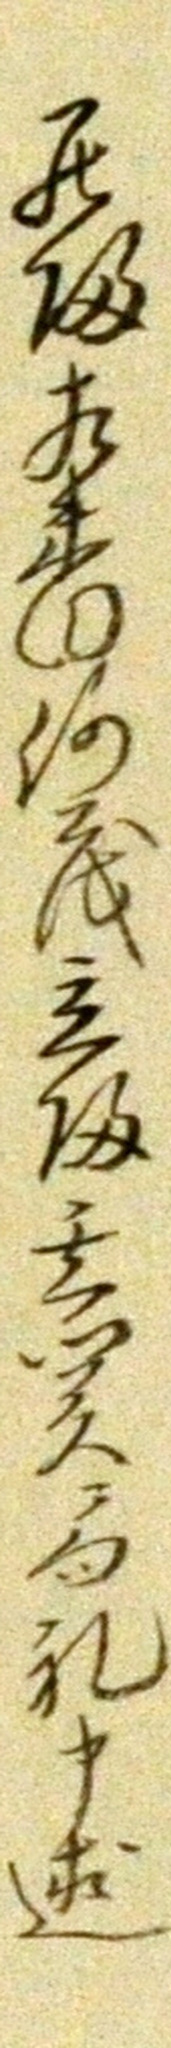罷帰相番何立帰玄関ニ而礼申述
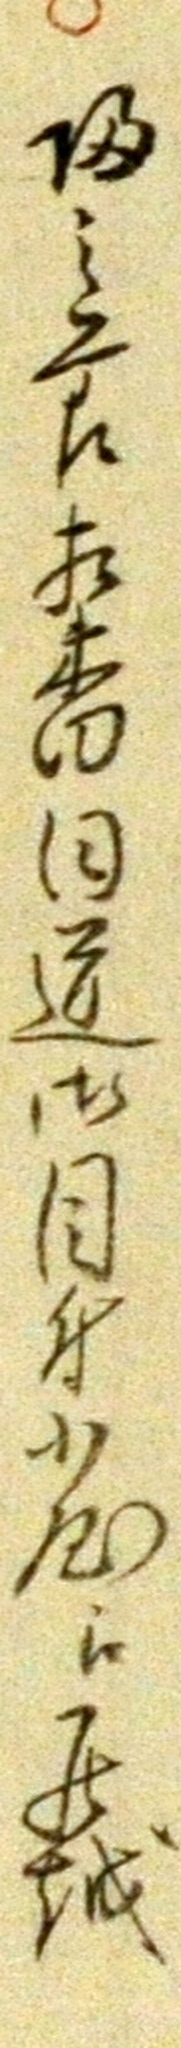帰之節相番同道御目付小屋江罷越
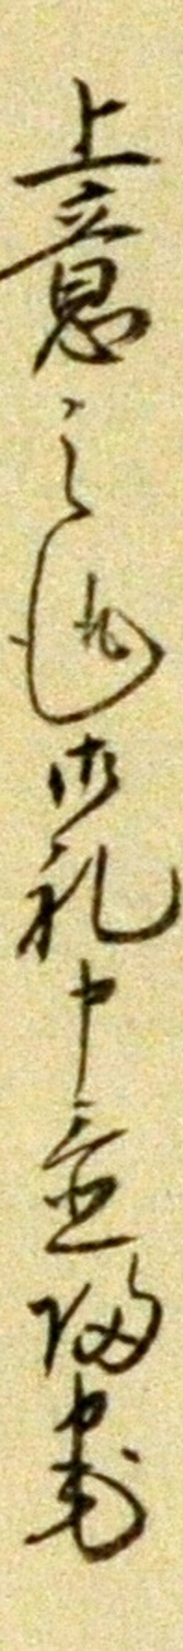上意之趣御礼申置帰宅
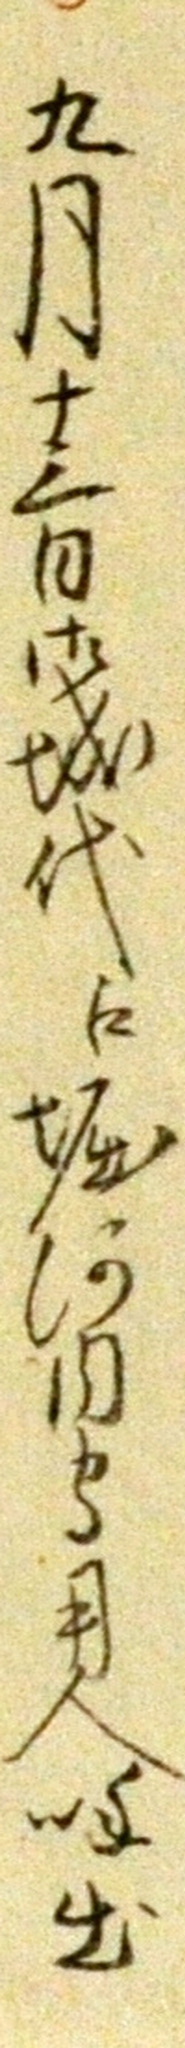九月十三日御城代江堀河内守用人呼出
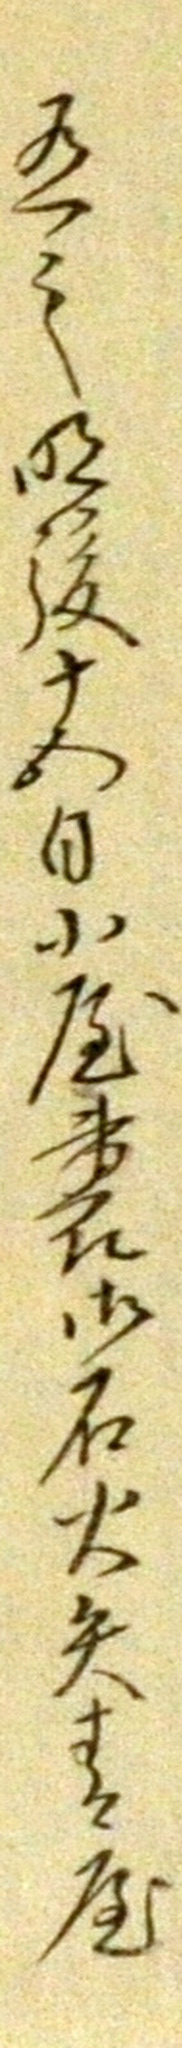有之明後十五日小屋裏御石火矢青屋
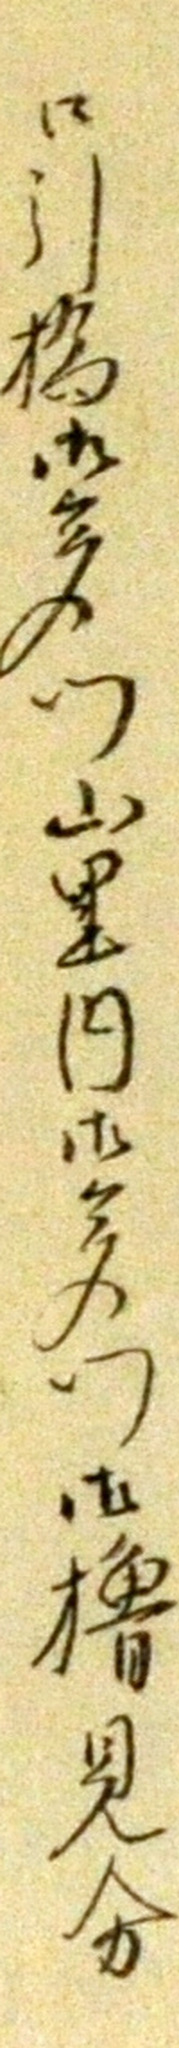口引橋御多門山里内御多門御櫓見分
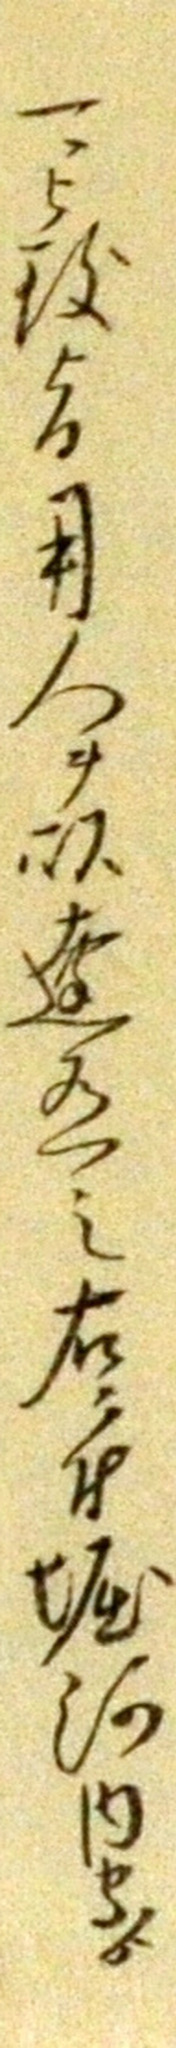可被致旨用人ヲ以達有之右ニ付堀河内守ゟ
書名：大阪加番関係諸書留〔一括〕
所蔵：伊那市立高遠町図書館・合同会社AMANE
